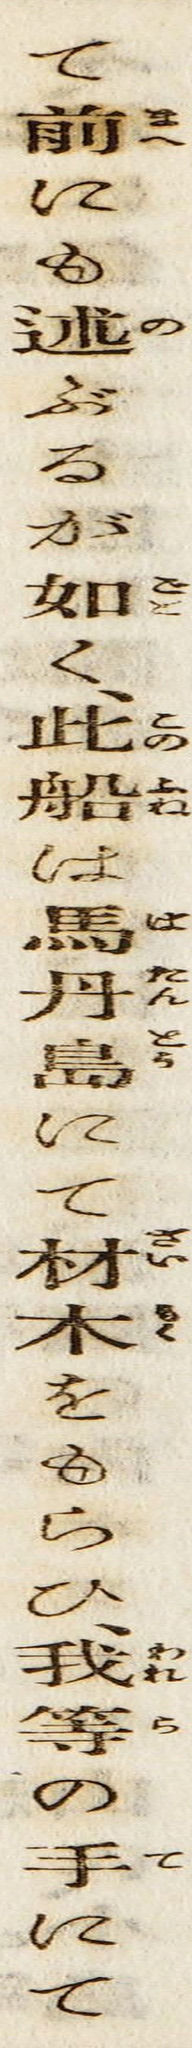て前にも述ぶるが如く、此船は馬丹島にて材木をもらひ、我等の手にて
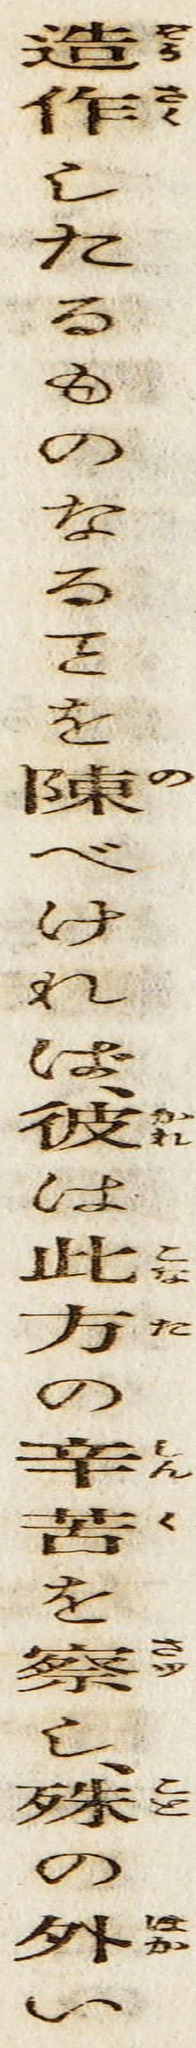造作したるものなることを陳べければ、彼は此方の辛苦を察し、殊の外い
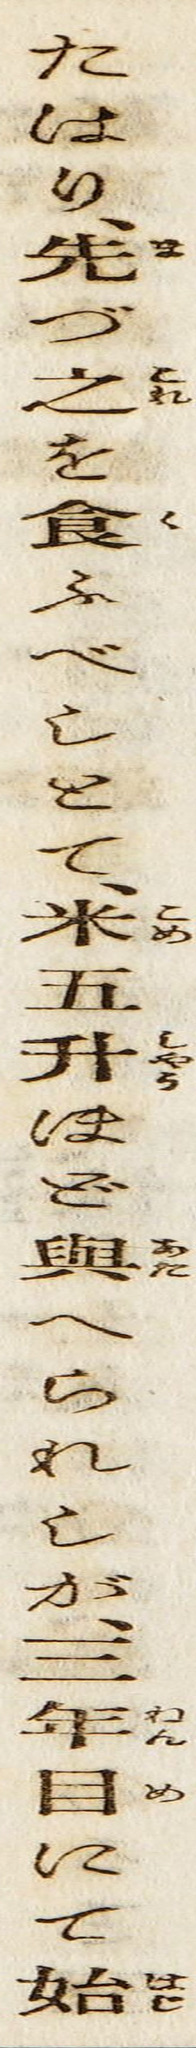たはり、先づ之を食ふべしとて、米五升ほど与へられしが、三年目にて始
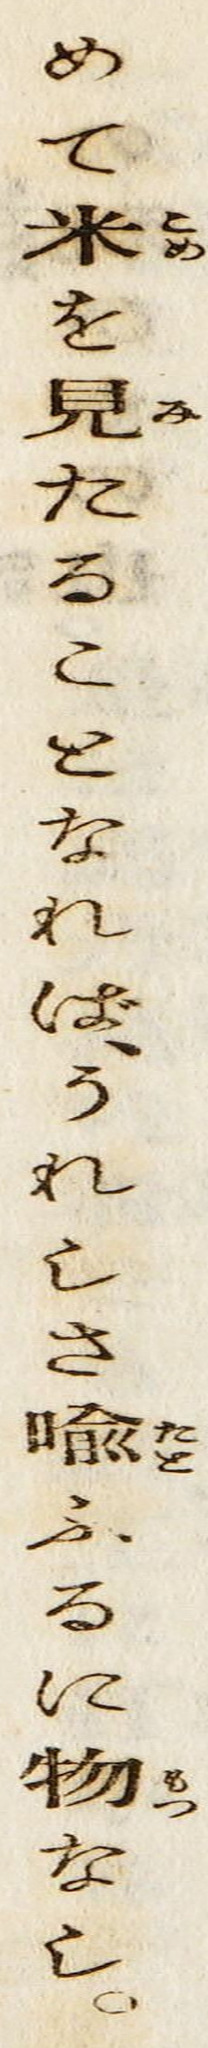めて米を見たることなれば、うれしさ喩ふるに物なし。
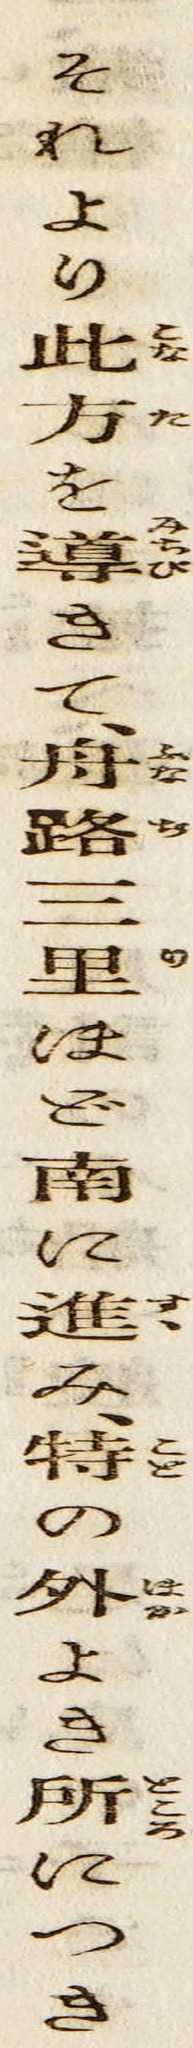それより此方を導きて、舟路三里ほど南に進み、特の外よき所につき
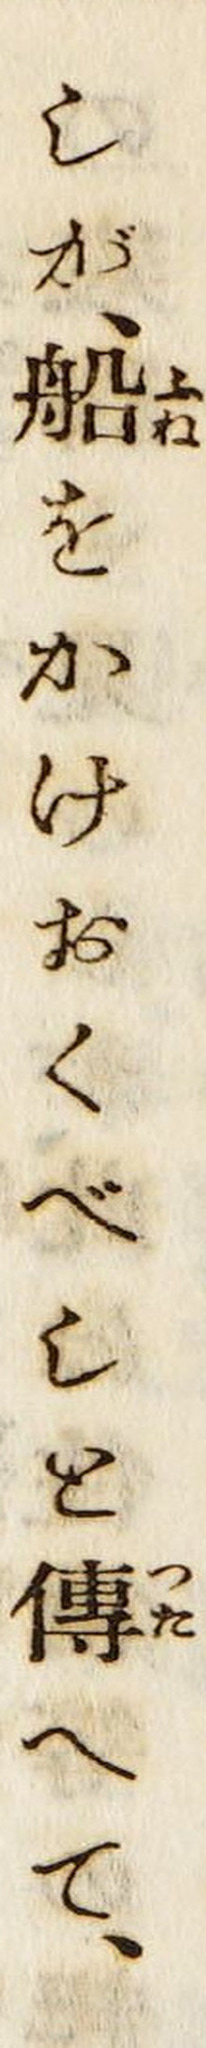しが、船をかけおくべしと伝へて、
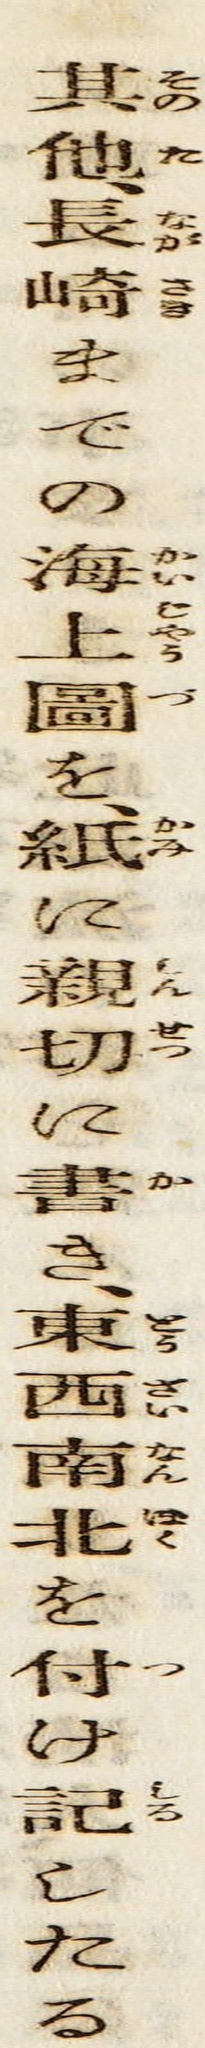其他、長崎までの海上図を、紙に親切に書き、東西南北を付け記したる
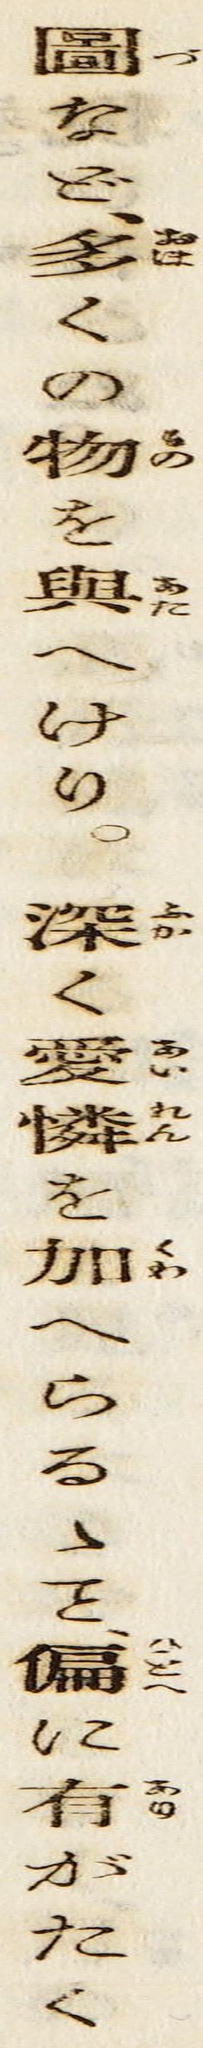図など、多くの物を与へけり。深く愛隣を加へらるゝこと、偏に有がたく
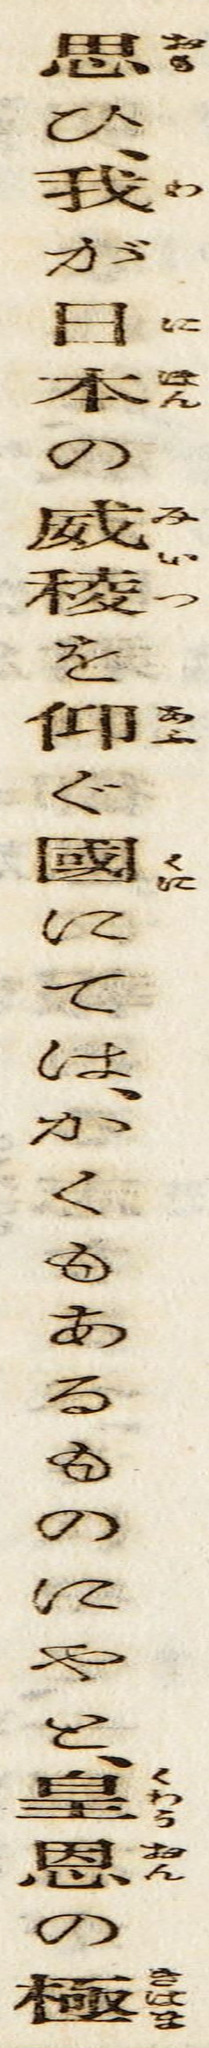思ひ、我が日本の威稜を仰ぐ国にては、かくもあるものにやと、皇恩の極
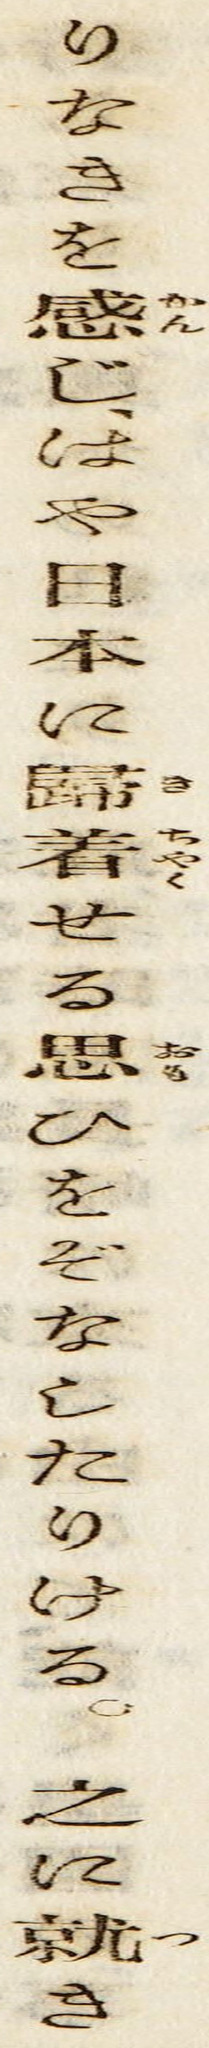りなきを感じ、はや日本に帰着せる思ひをぞなしたりける。之に就き
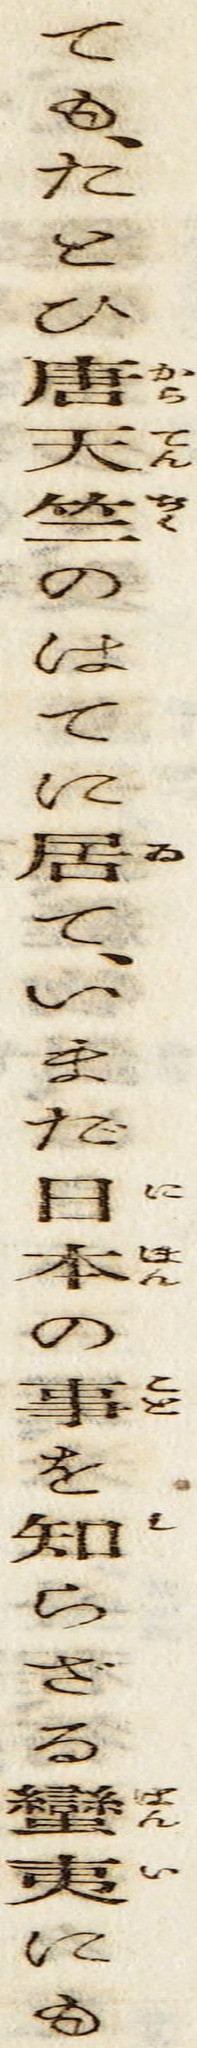ても、たとひ唐天竺のはてに居て、いまだ日本の事を知らざる蛮夷にも
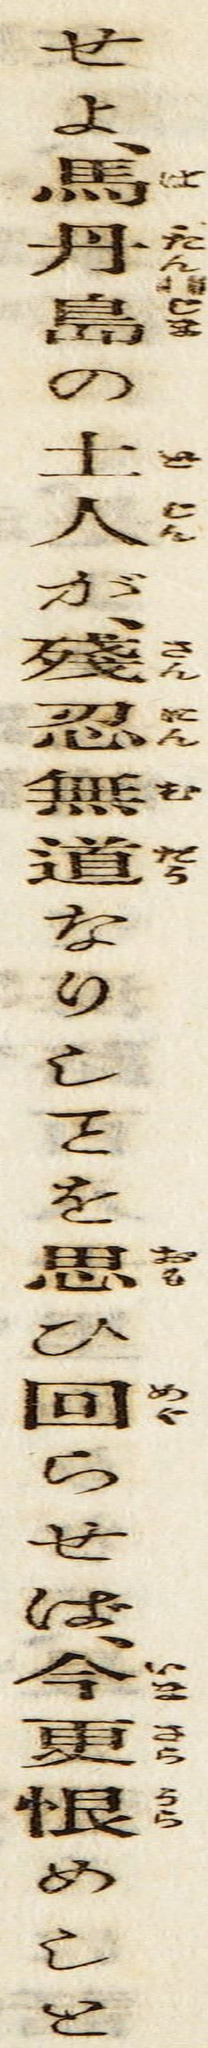せよ、馬丹島の土人が、残忍無道なりしことを思ひ回らせば、今更恨めしと
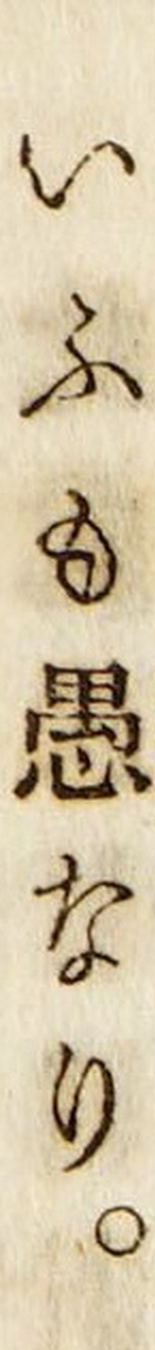いふも愚なり。

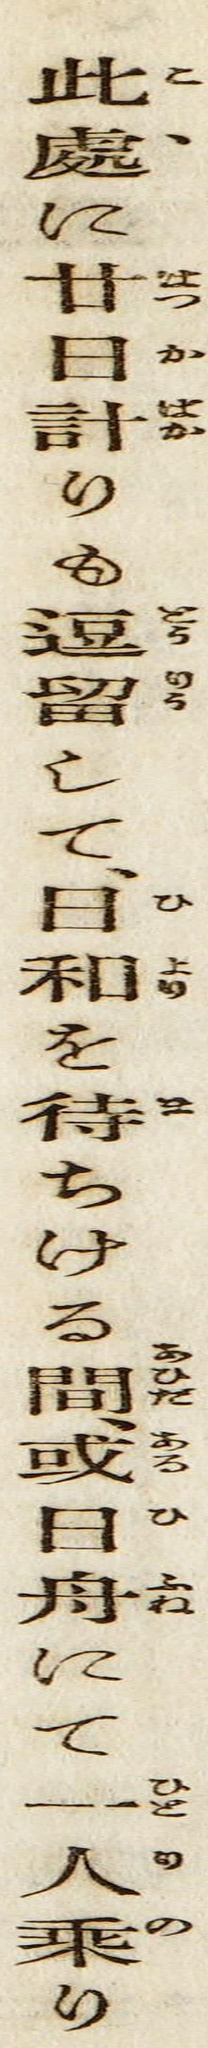此処に廿日計りも逗留して、日和を待ちける間、或日舟にて一人乗り
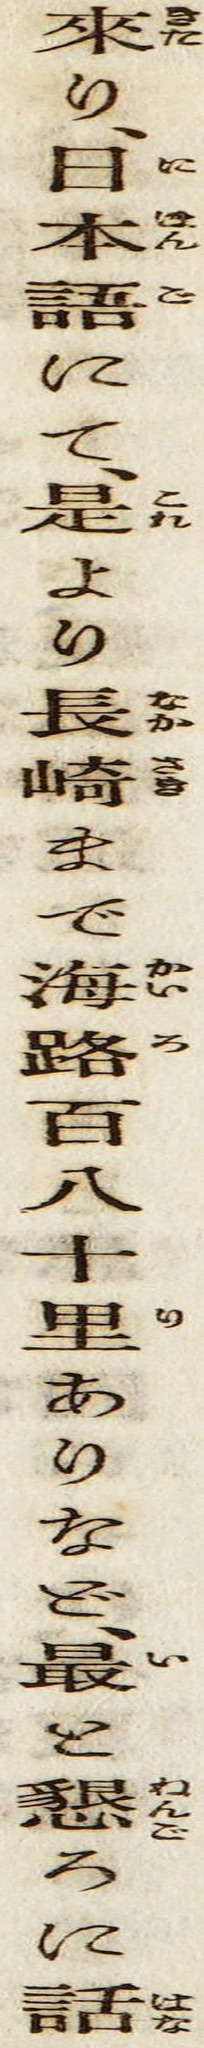来り、日本語にて、是より長崎まで海路百八十里ありなど、最と懇ろに話
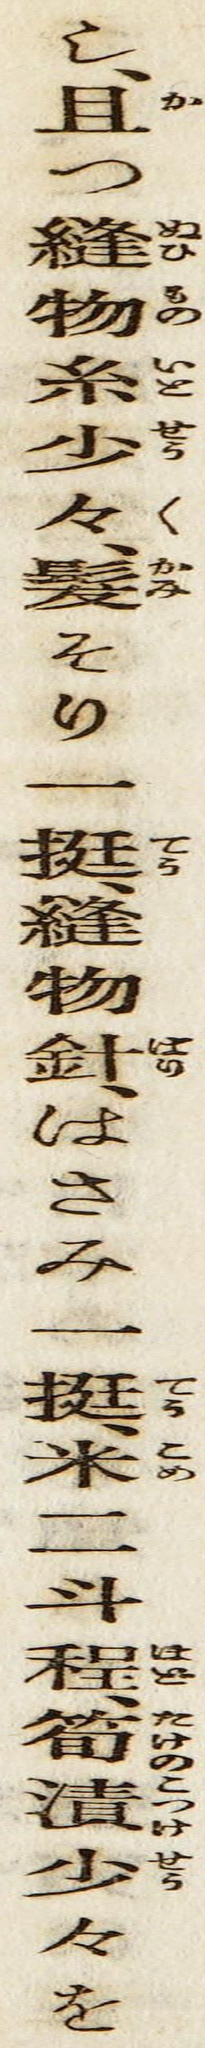し、且つ縫物糸少々、髪そり一挺、縫物針、はさみ一挺、米二斗程、筍漬少々を
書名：日本漂流譚
